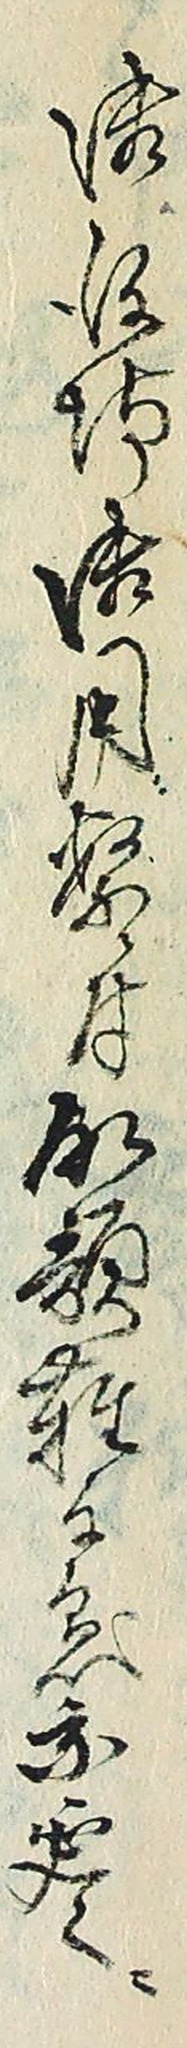御役場御用繁ニ付取頻難手懸亦延々ニ
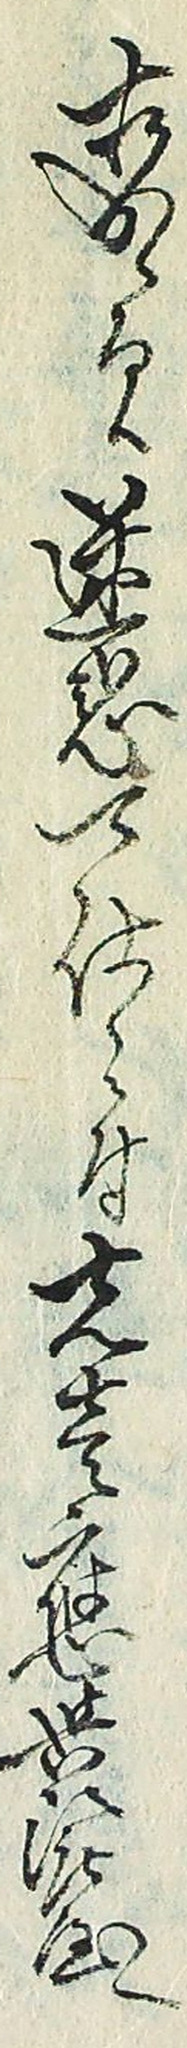相成候而ハ迷惑可仕候ニ付先壱應與頭庄屋へ
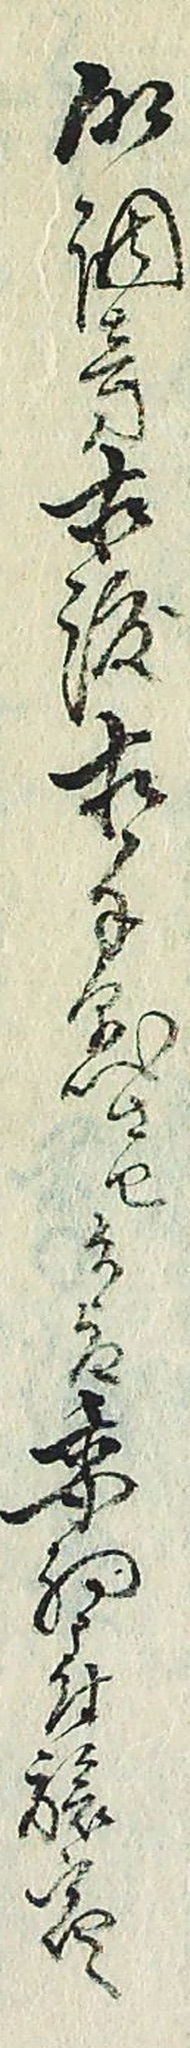取調旁相渡相手懸させ候旨委細申付旅宿へ
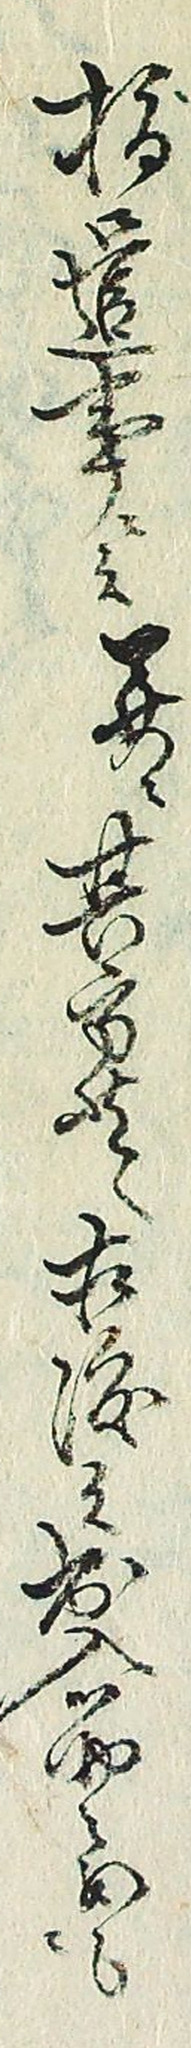指遣事ニ候幷ニ其方共へ相渡候出入筋之義も
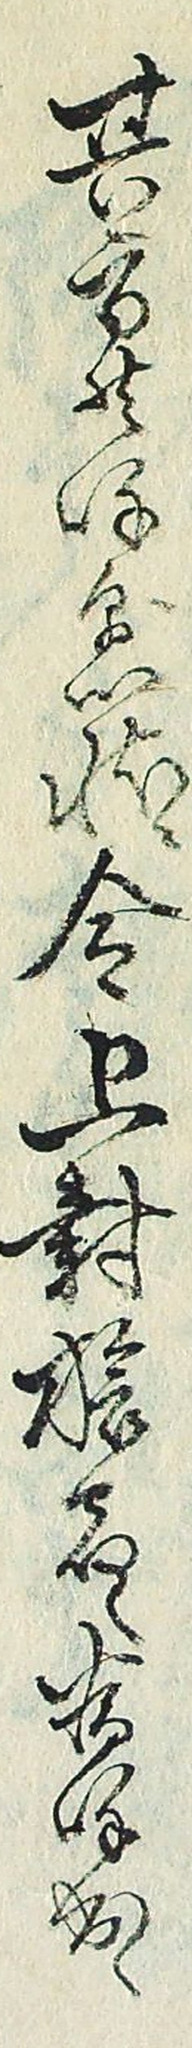其方共呼懸状ニ令上封旅宿へ為呼出候
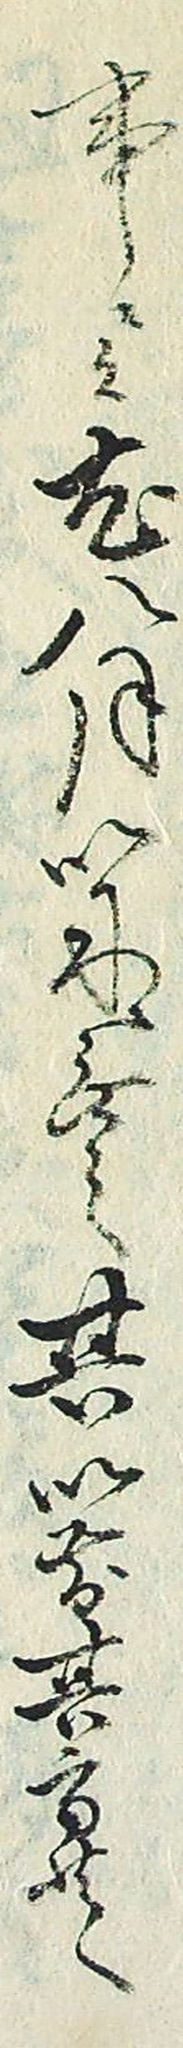事ニ候尤八月以来ニ無之其以前其方共へ
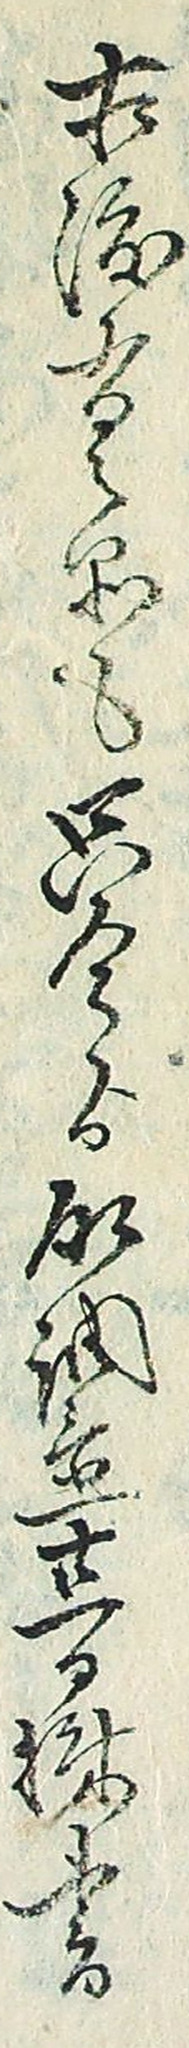相渡有之品も只今ゟ取調置廿一日株書
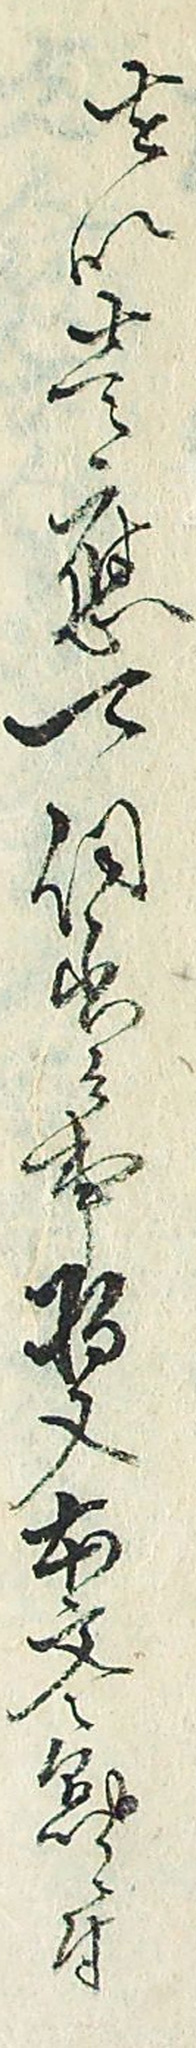を以壱應可伺出候事将又本文之懸りニ付

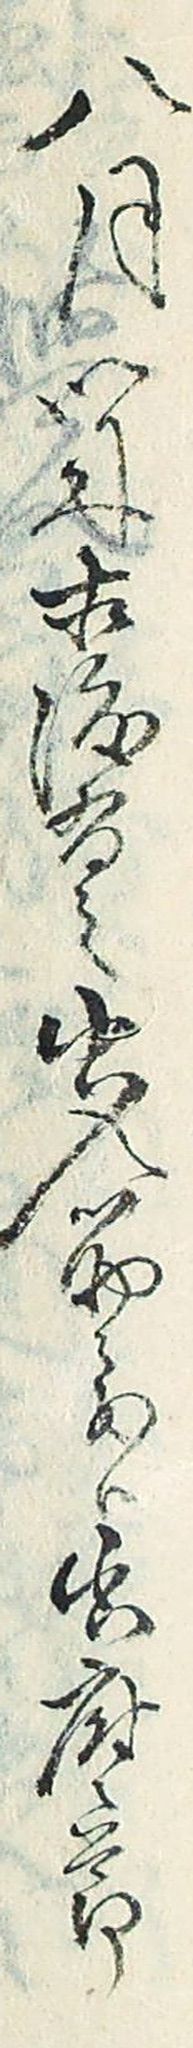八月以来相渡有之出入筋之義ハ出府之節
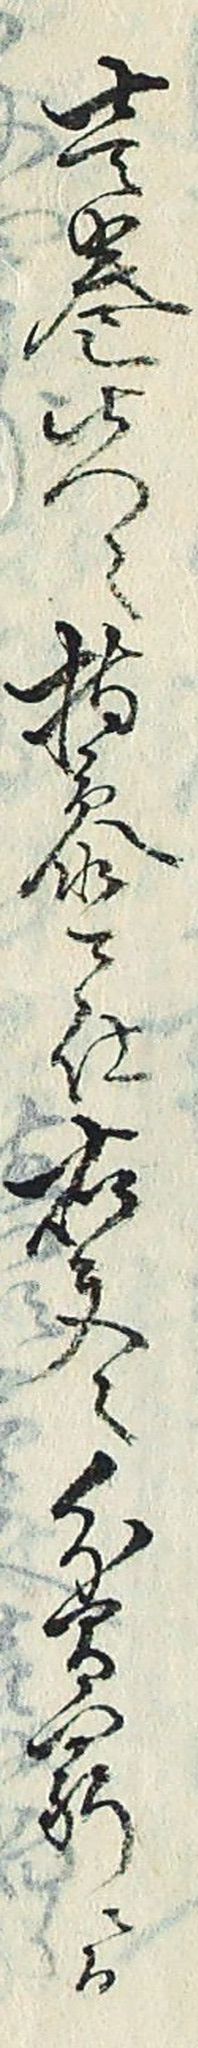壱巻夫々持参可仕右夫々貧窮ニ而
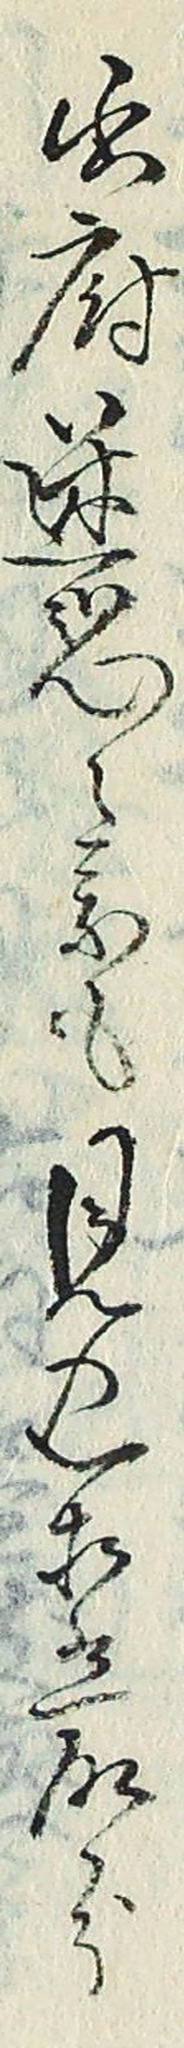出府迷惑之義も見込相立取分
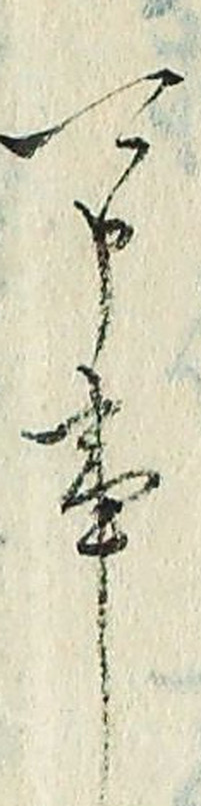可申事
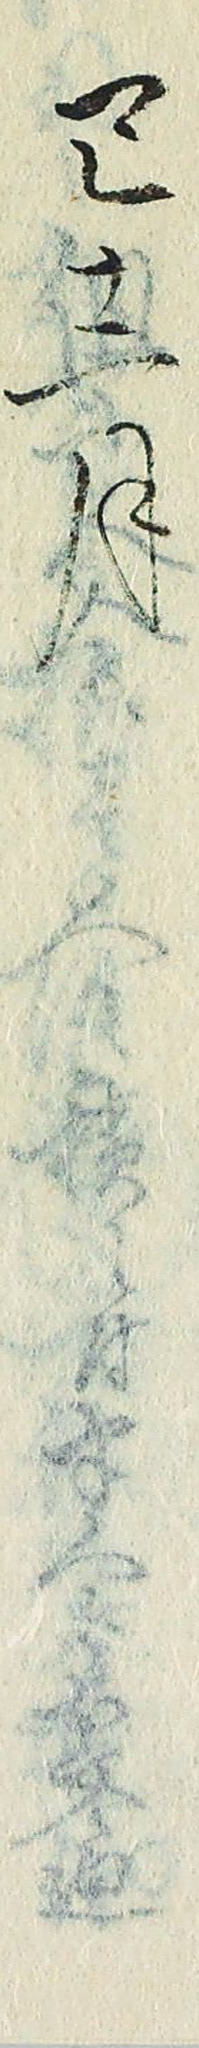巳十二月
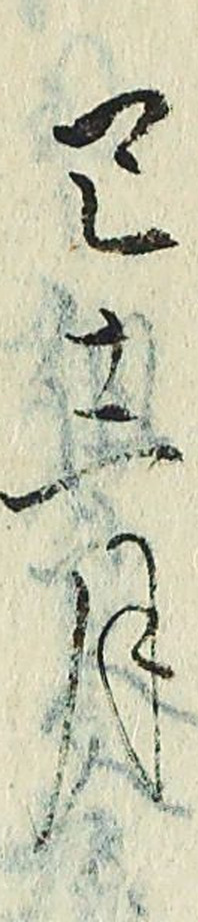巳十二月

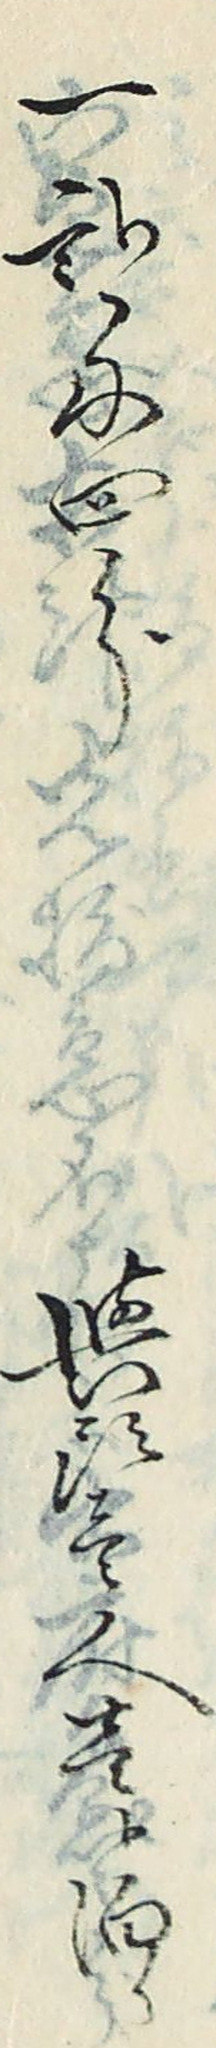一弐匁四分與頭壱人壱ト泊り
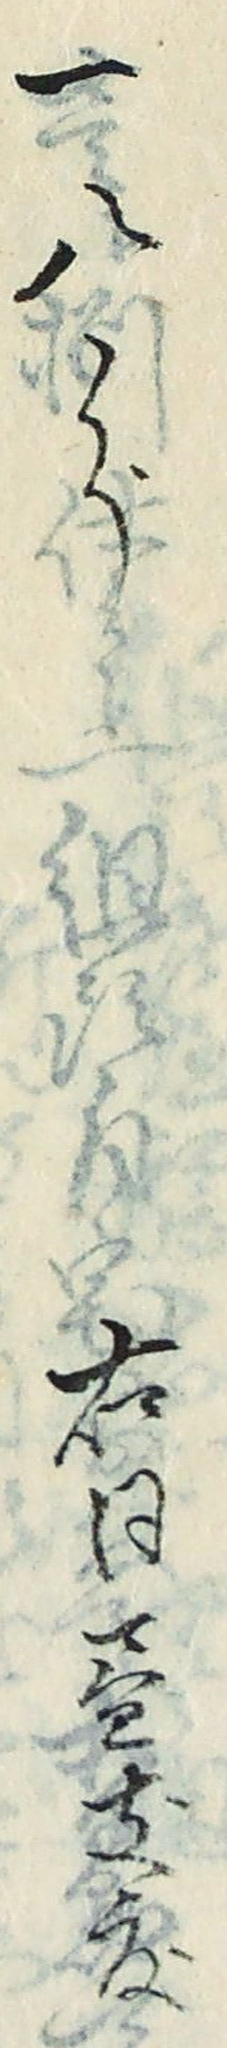一八分右同昼仕度
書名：諸御趣意書并御下知向之写
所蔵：鳴門教育大学 Naruto University of Education
